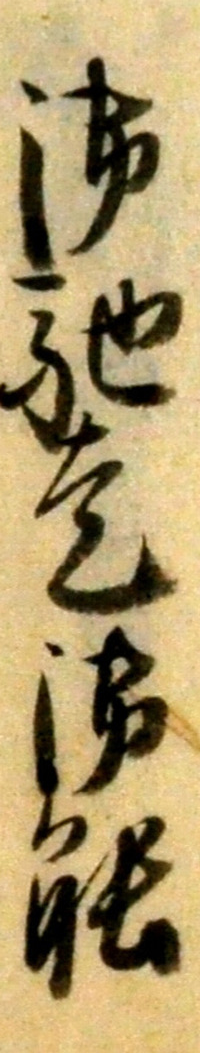御馳走御能

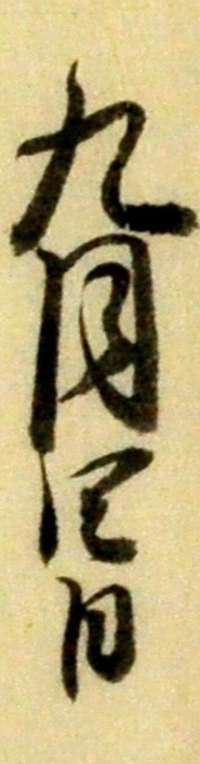九月四日
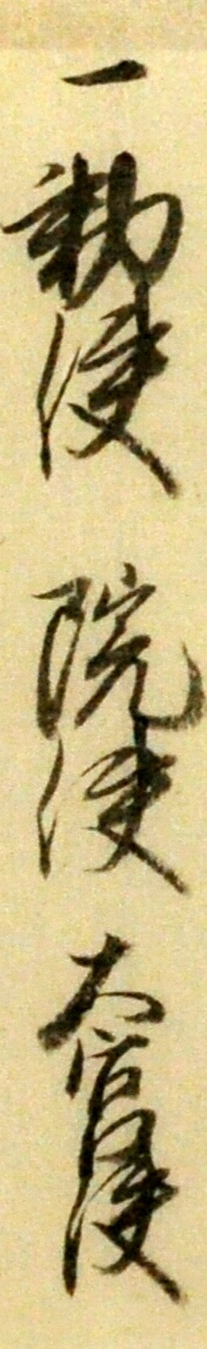一勅使院使大宮使
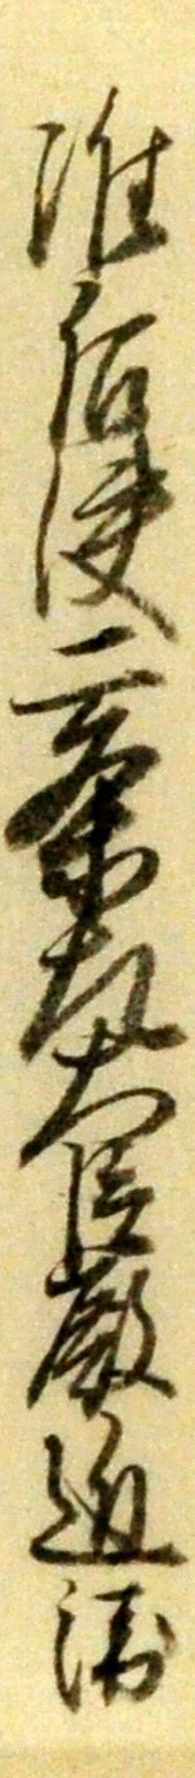准后使二条左大臣殿近衛
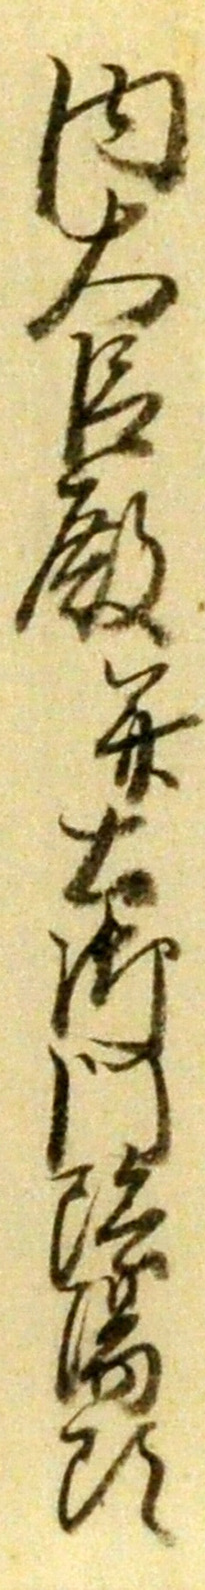内大臣殿并土御門陰陽頭
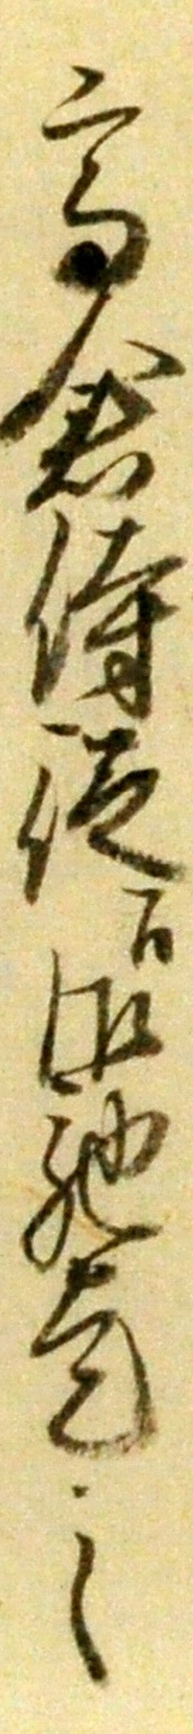高倉侍従え御馳走之
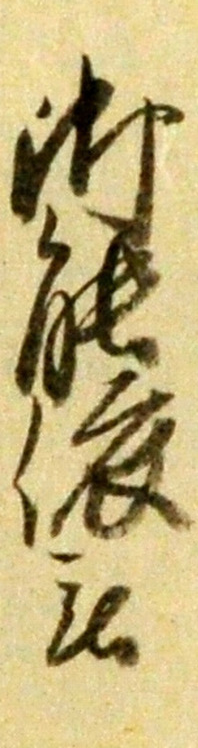御能依被
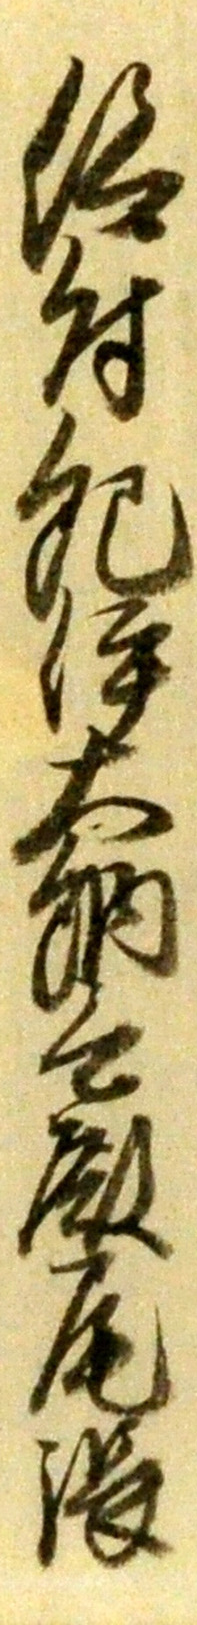仰付紀伊大納言殿尾張
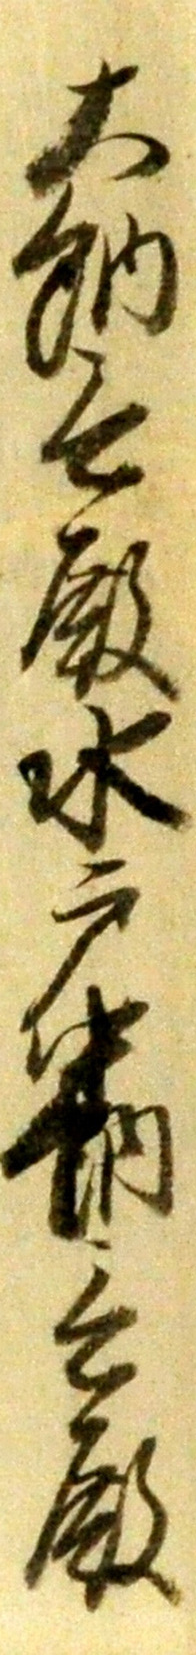大納言殿水戸中納言殿
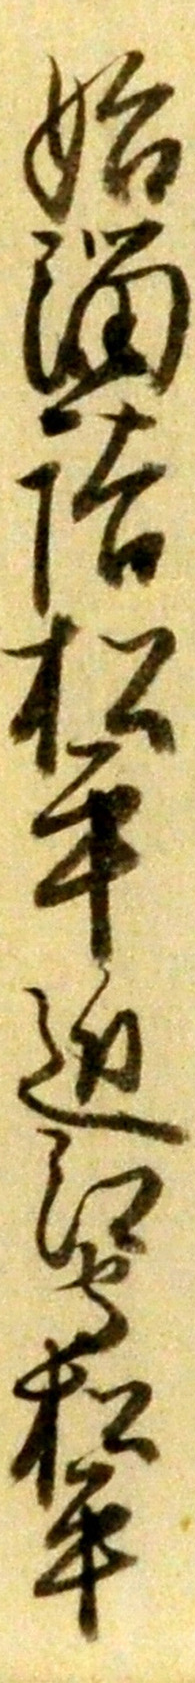始溜詰松平近江守松平
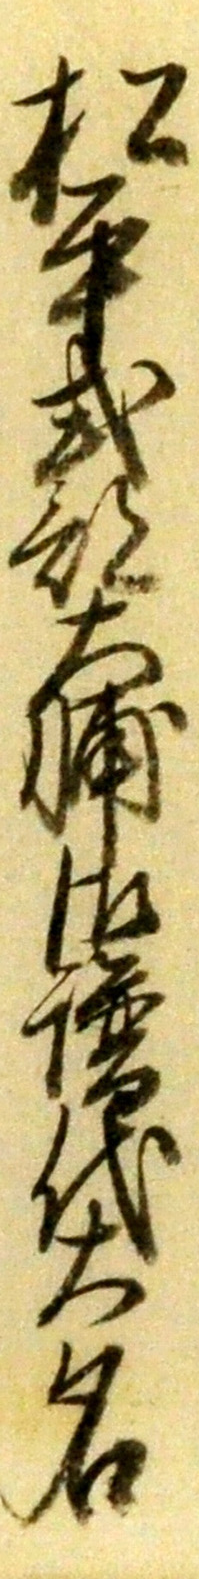松平式部大輔御譜代大名
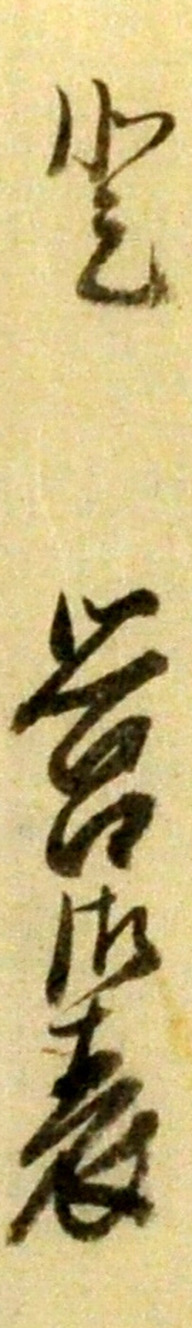登営御表
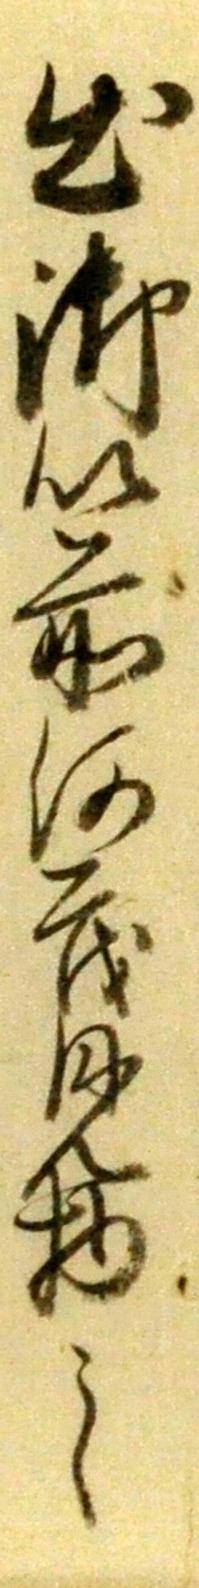出御以前何も見物之
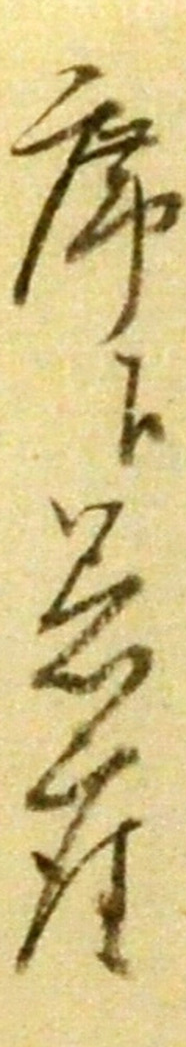席え着座
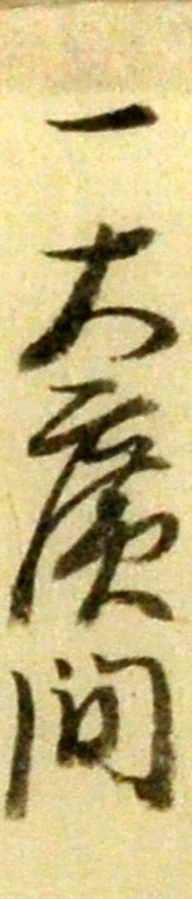一大広間
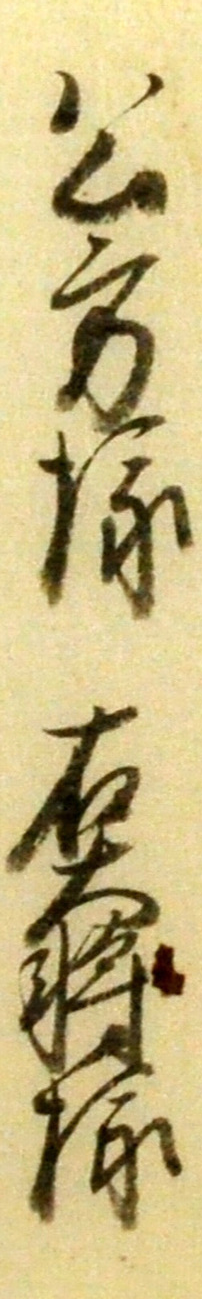公方様右大将様
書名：御馳走御能ノ節ノ留外
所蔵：伊那市立高遠町図書館・合同会社AMANE
